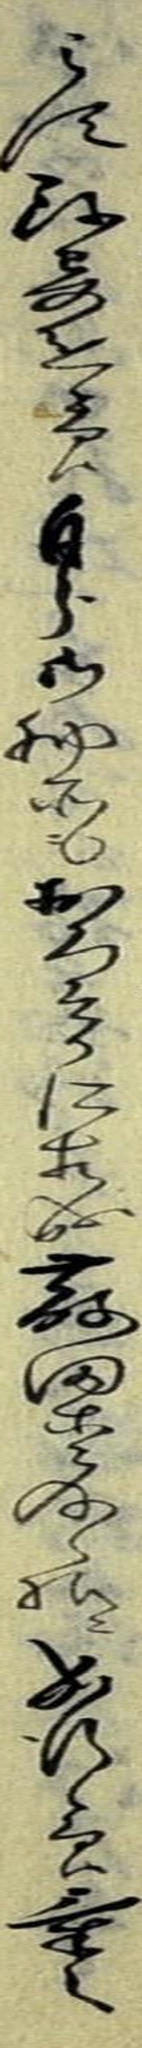みす致寄進候而は自ら御納所もおろそかに相成散田等に及候様に成行候而は気之
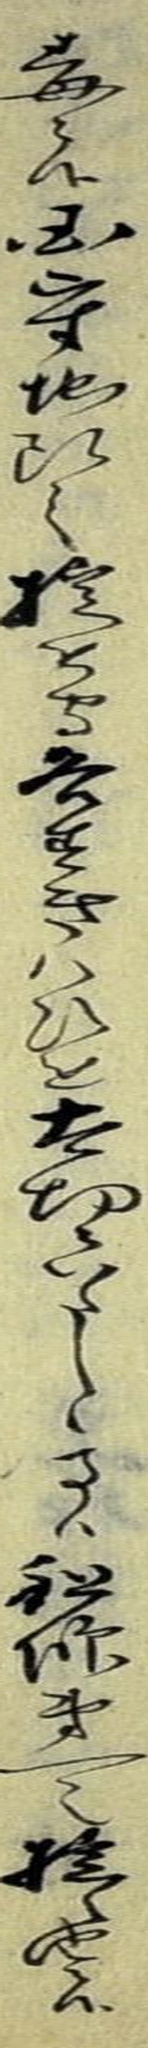毒に候国守地頭之掟を守各すきはひを太切にいたし候事は祖師第一之掟之由に候
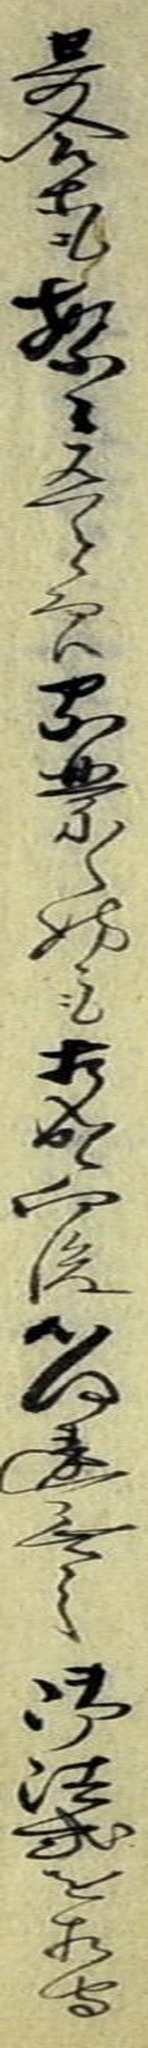寄合等も繁々有之候而は家業之妨にも相成候向後心得違無之御法式を相守
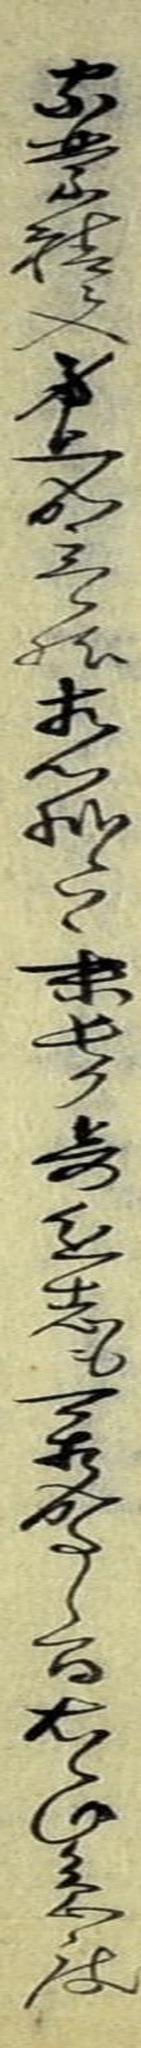家業精に入身上成立候様相心掛候はゝ末長く寄進志も可相成事候間右之趣意急度
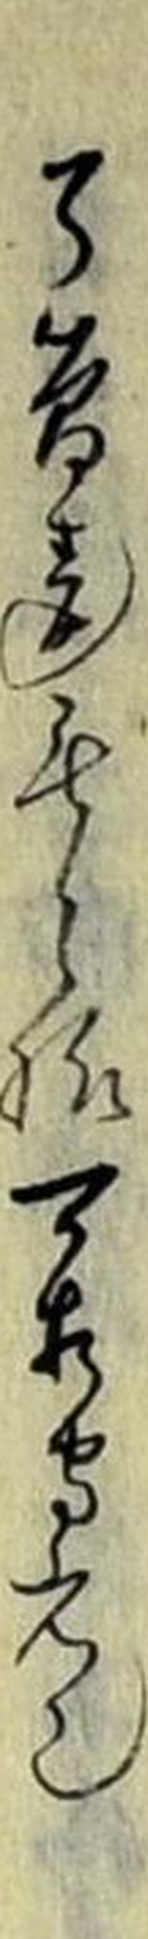了簡違無之様可相守者也
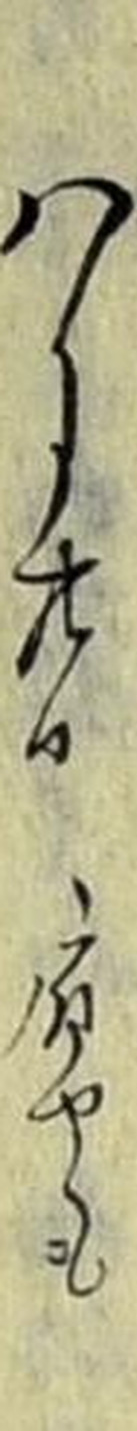八月廿日府中へも

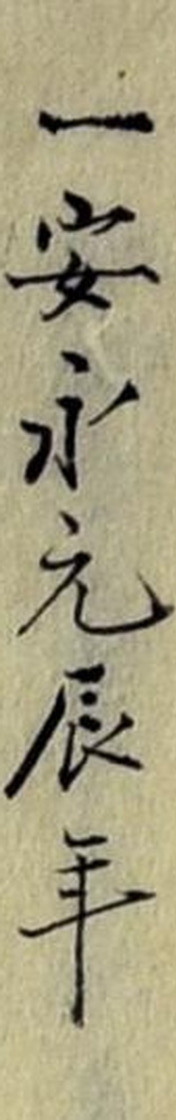一安永元辰年
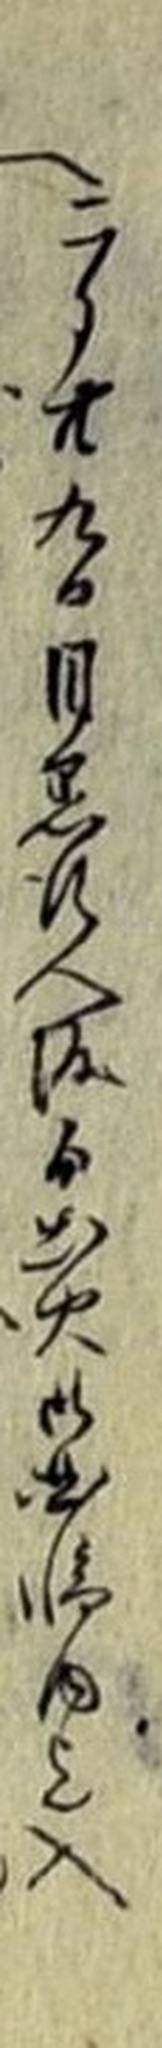二月廿九日目黒行人坂ゟ出火御曲輪内迄入諸月番
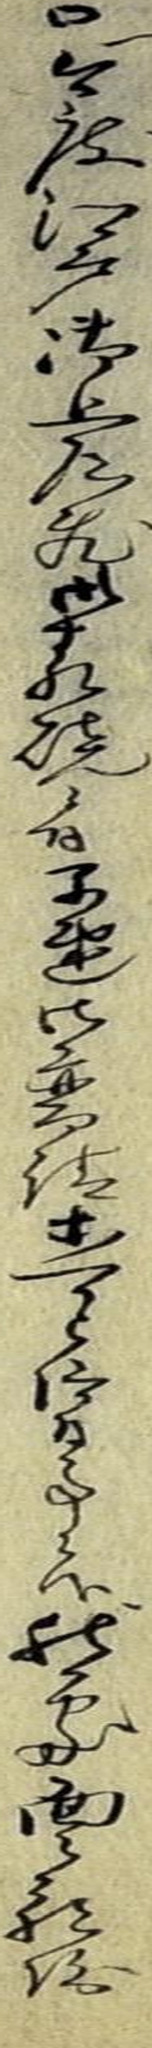〇今度江戸御上屋敷御類焼に付早速御普請等可被仰付事に候然処面々難儀
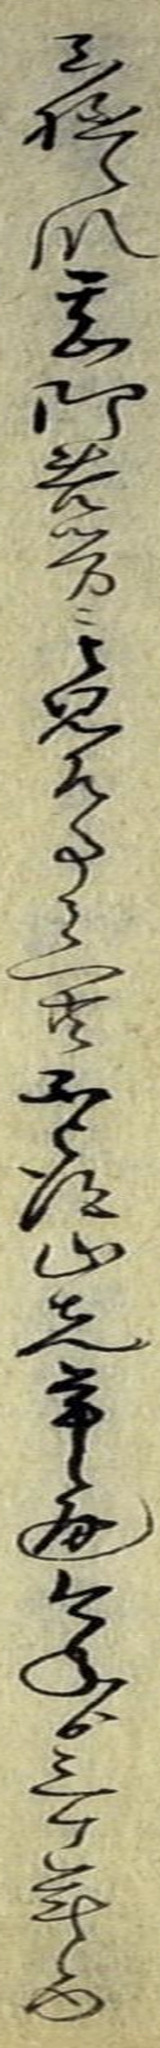至極之段甚御苦労に被思召事に候へ共不被得止先年之通今年ゟ三ケ年之内
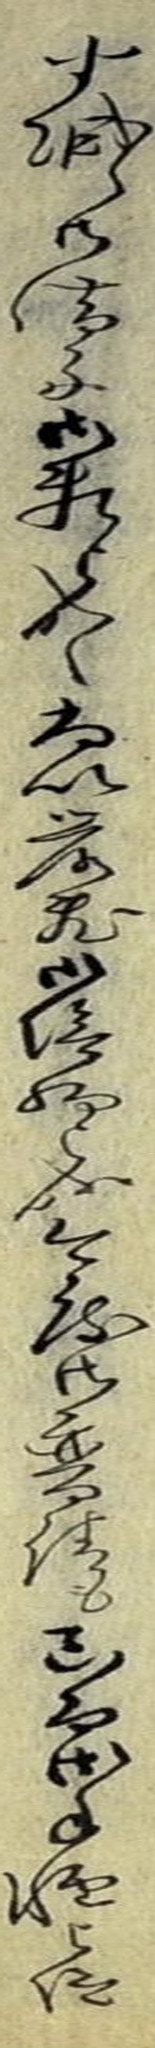半減之御借米御頼被成候尚以厳敷御倹約被成今度御普請も至而手軽被仰
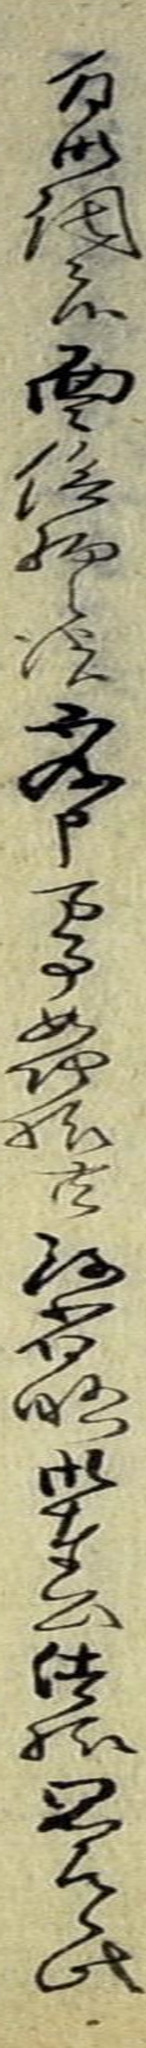付御調に候面々倹約之儀は不及申万事如何様共致省略御奉公仕候様思召候此
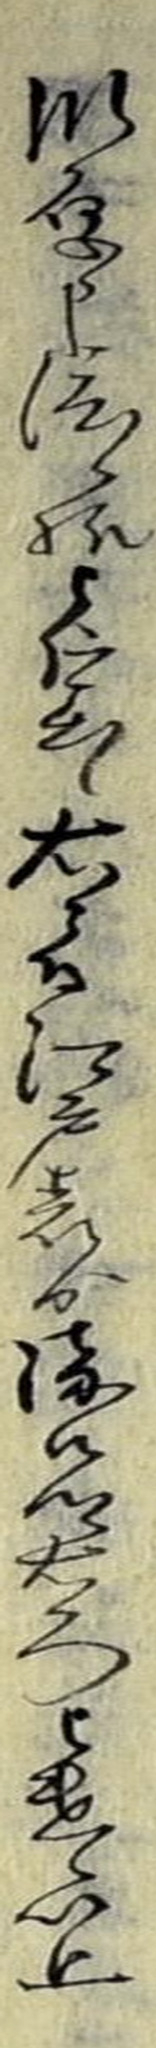段厚申渡候様被仰出候右に付江戸表ゟ溝口郷右衛門被遣候以上
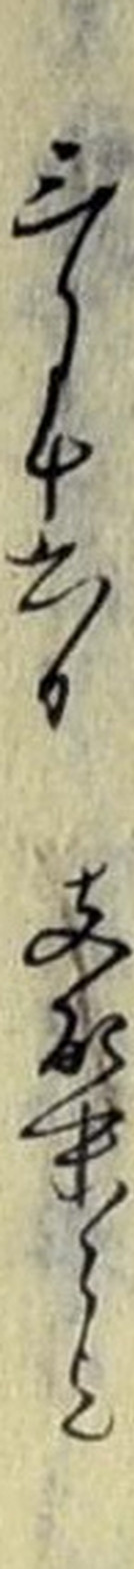三月十六日支配末々迄
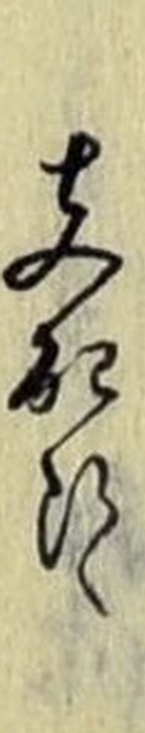支配頭へ
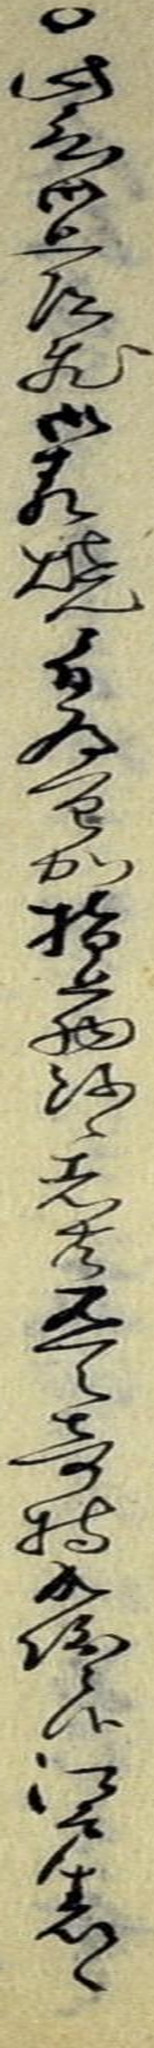〇此度御上屋敷御類焼に付為冥加指上物致候者共有之奇特成儀に候江戸表へ
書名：命令之部 二
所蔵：福井県文書館 Fukui Prefectural Archives
